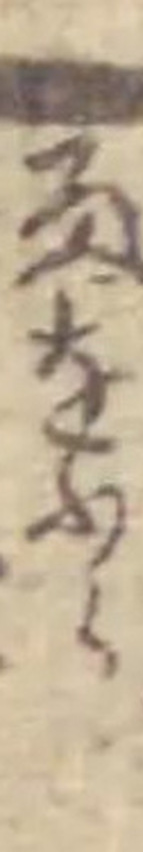雨をふら
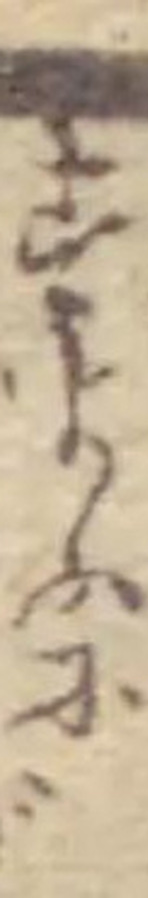すよふに
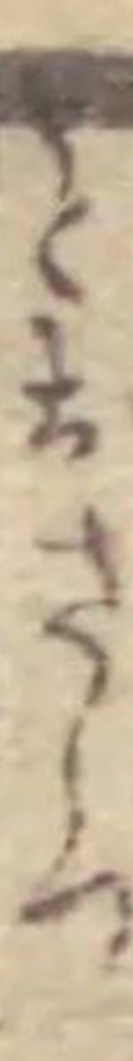とおさしづ
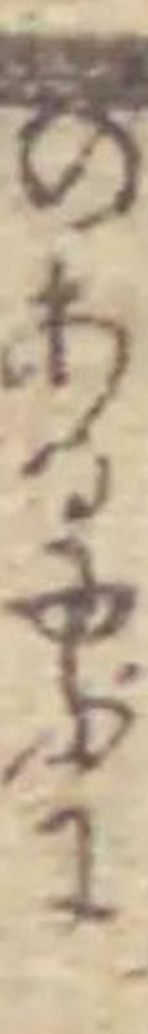のあるやふに
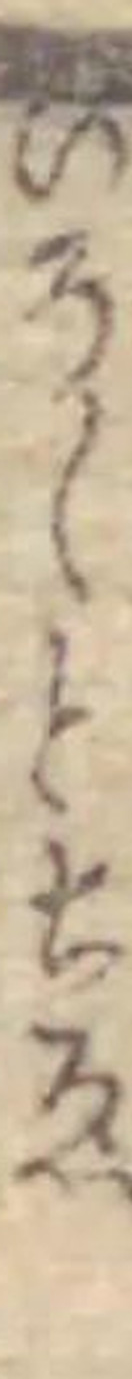いろ〳〵とちゑ
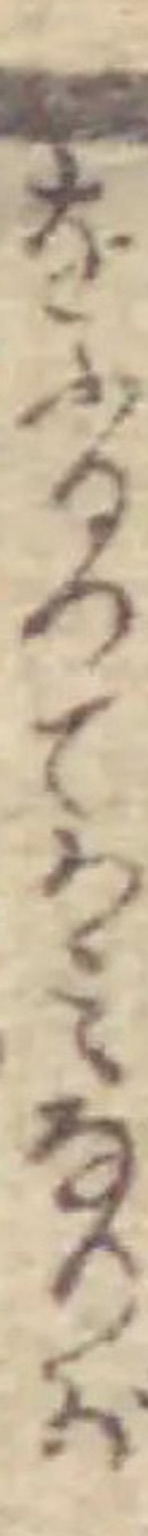をふるつてかみなりが
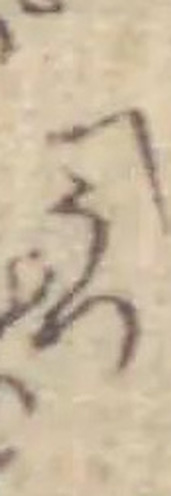〽うつ
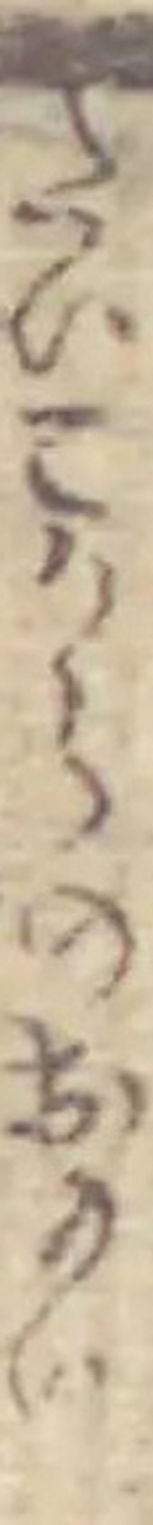たいこからのおもい
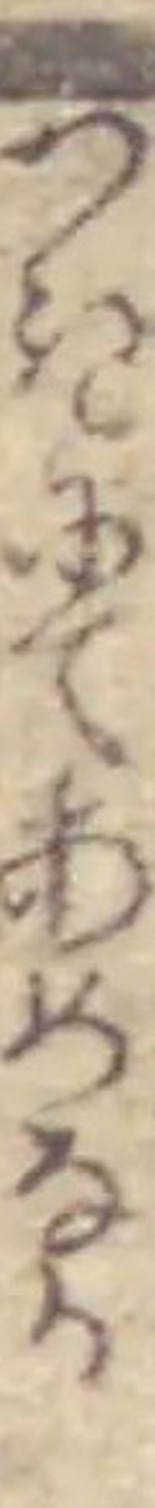つきにてあめなか
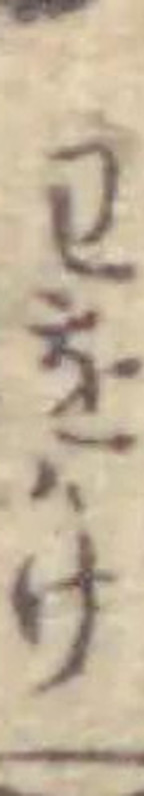わをかけ
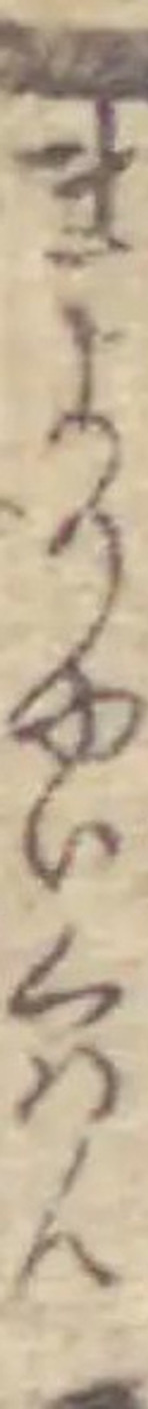まよりやいくはん
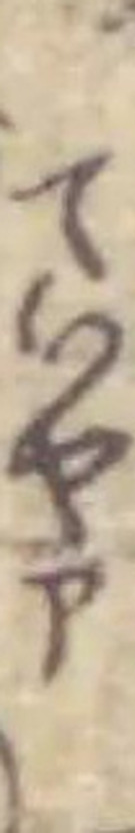ていやァ
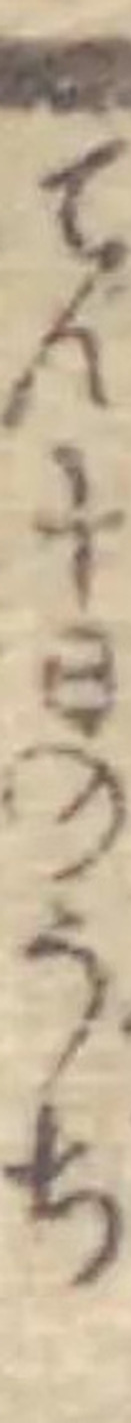てん十日のうち
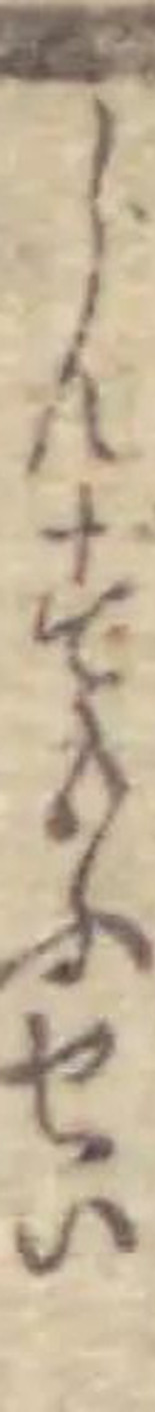じんずもふせい
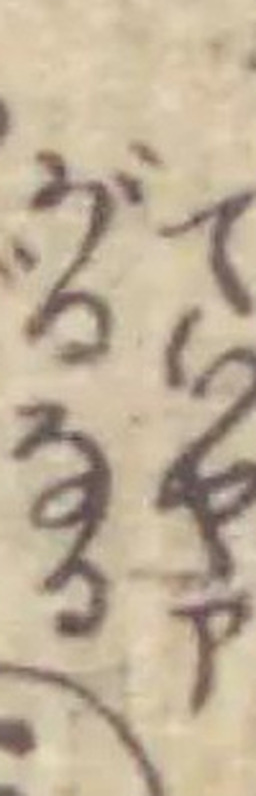がるなる
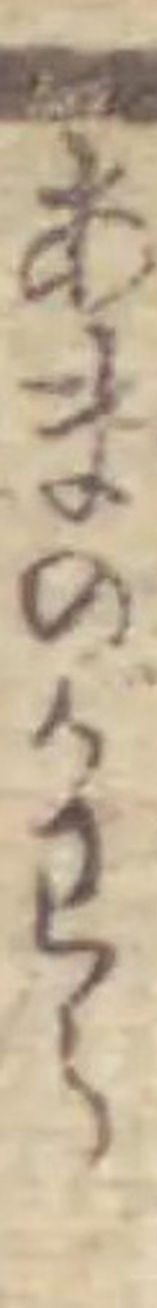あまのがわら
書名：雨宮風宮出儘略縁記 3巻
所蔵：国立国会図書館 National Diet Library, JAPAN
